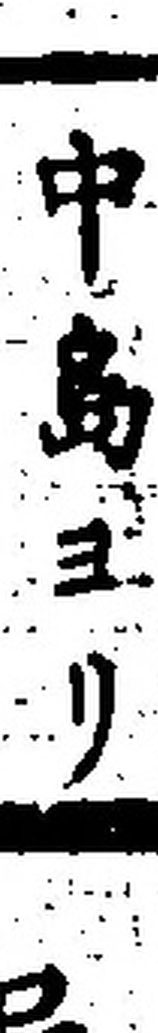中島ヨリ
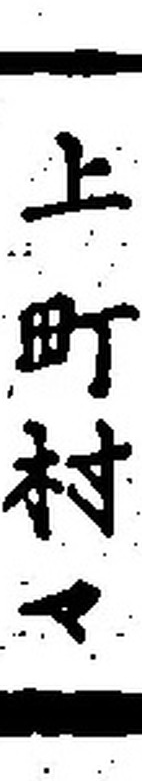上町村マ
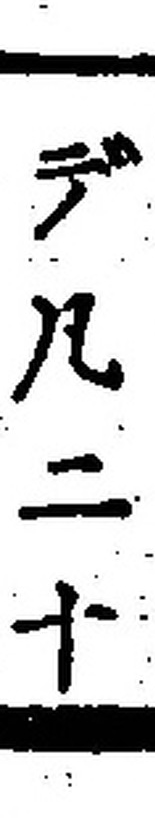デ凡二十
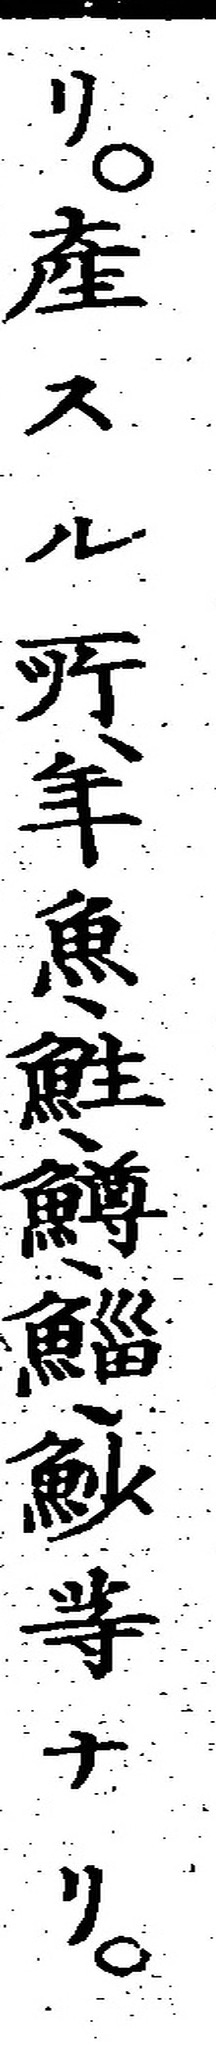リ。産スル所、年魚・鮏・鱒・鯔・魦等ナリ。
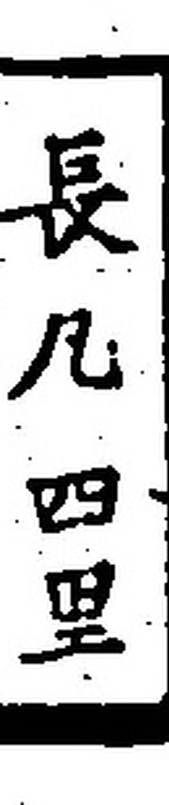長凡四里
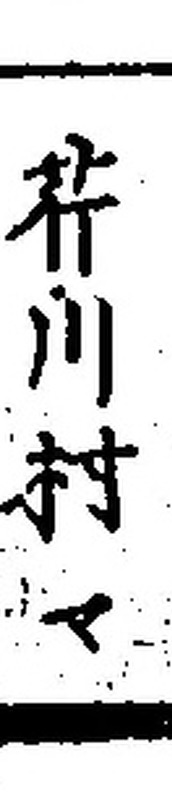芹川村マ
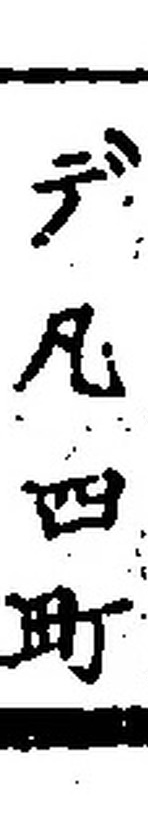デ凡四町
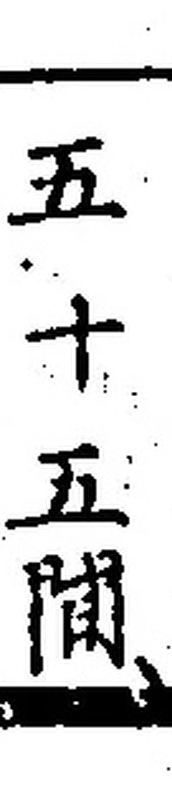五十五間、
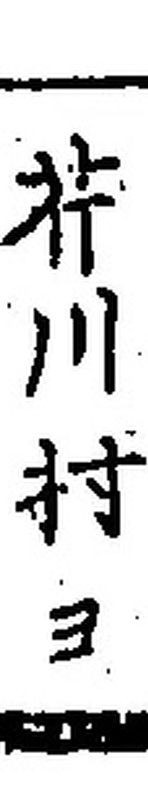芹川村ヨ
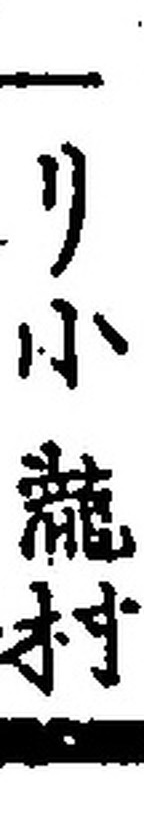リ小滝村
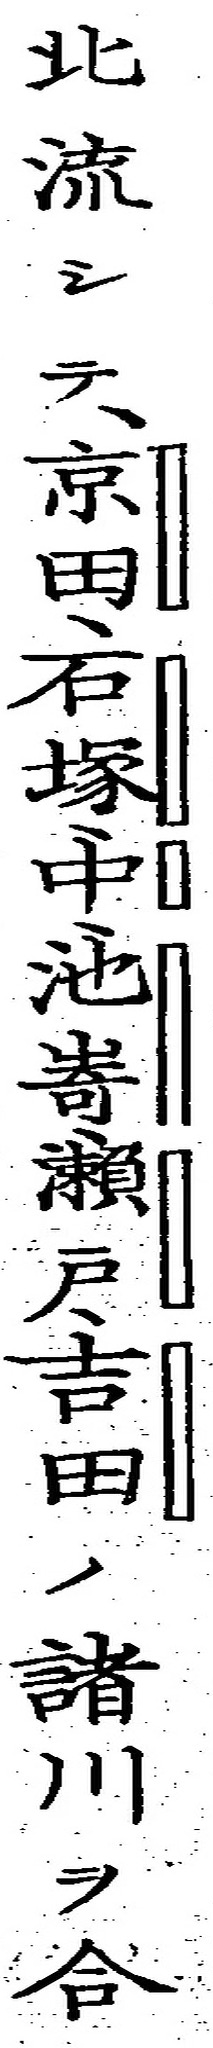北流シテ、京田・石塚・中・池崎・瀬戸・吉田ノ諸川ヲ合
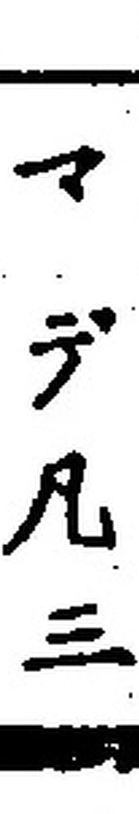マデ凡三
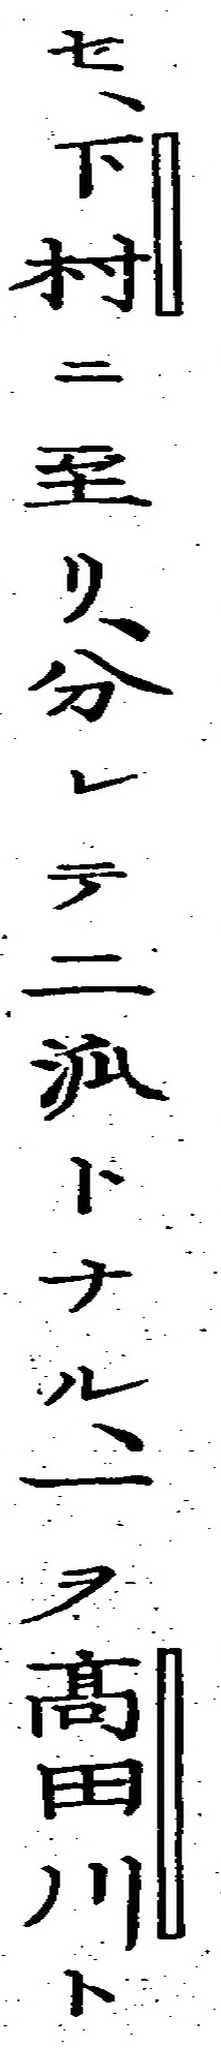セ、下村ニ至リ、分レテ二派トナル、一ヲ高田川ト
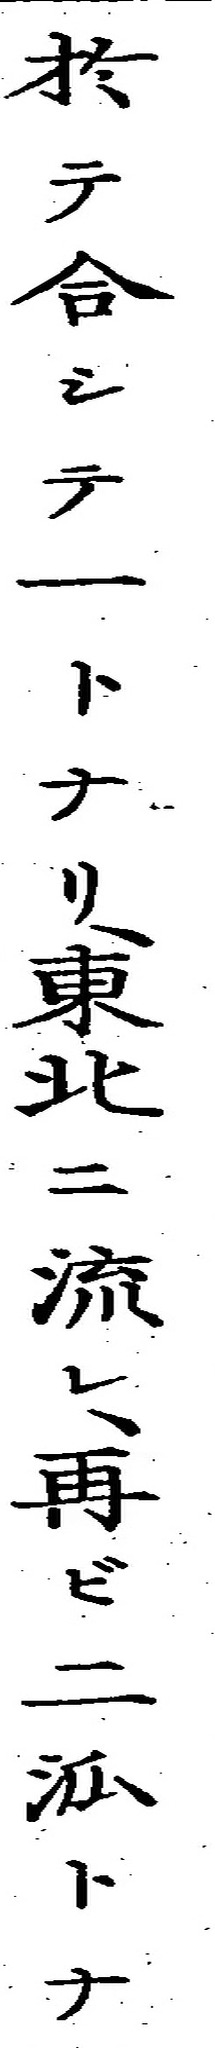於テ合シテ一トナリ、東北ニ流レ、再ビ二派トナ
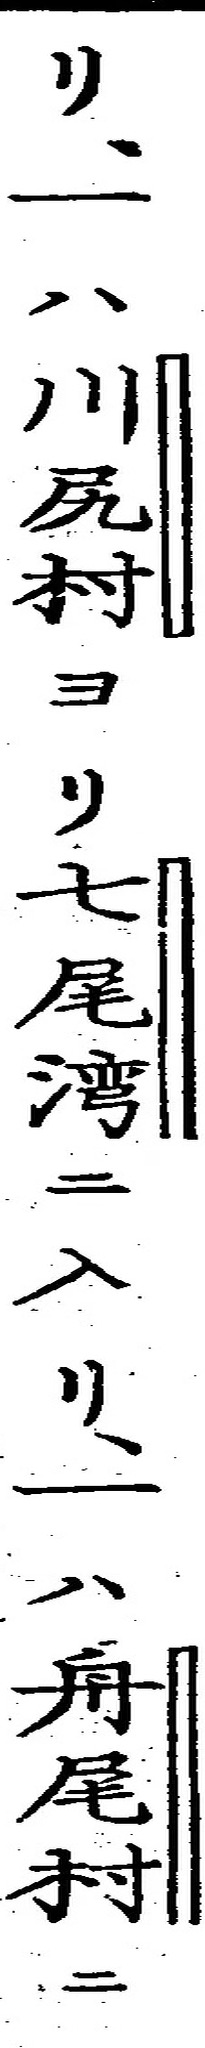リ、一ハ川尻村ヨリ七尾湾ニ入リ、一ハ舟尾村ニ

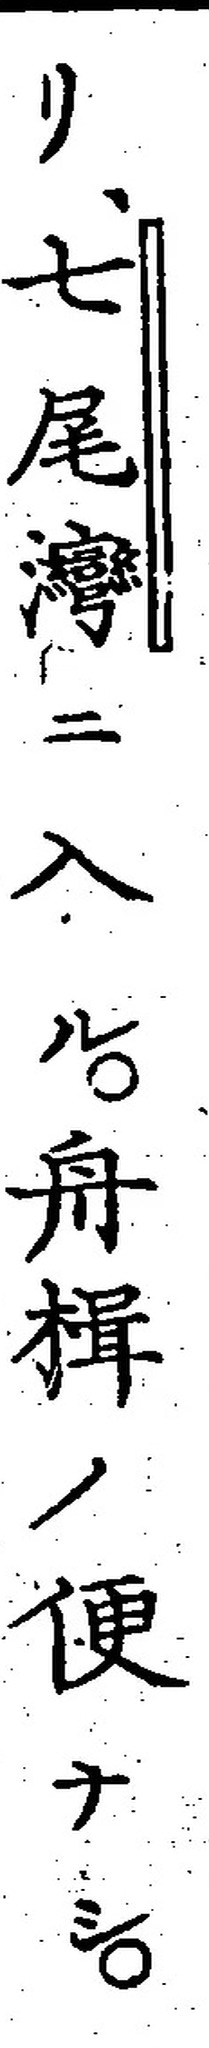リ、七尾湾ニ入ル。舟楫ノ便ナシ。
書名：能登地誌略
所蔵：国立国会図書館 National Diet Library, JAPAN
